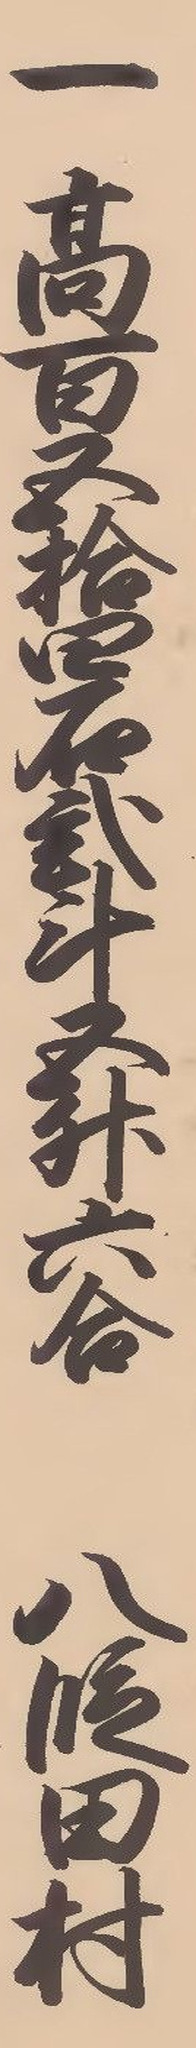一高百五拾四石弐斗五升六合八段田村
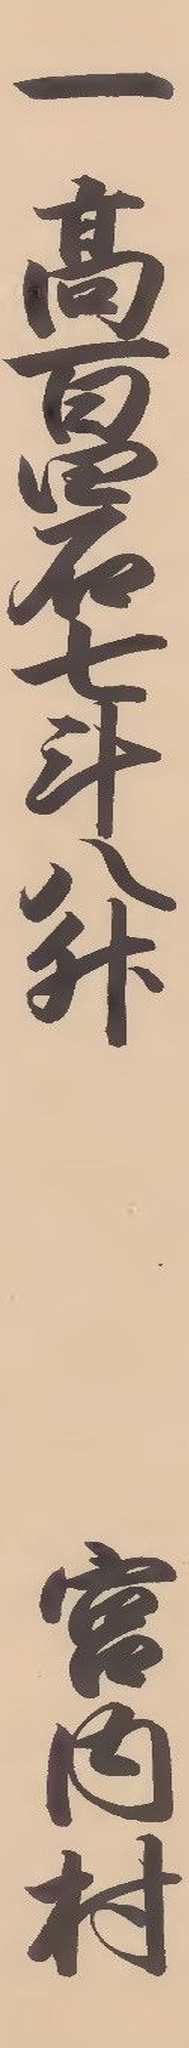一高百四石七斗八升宮内村
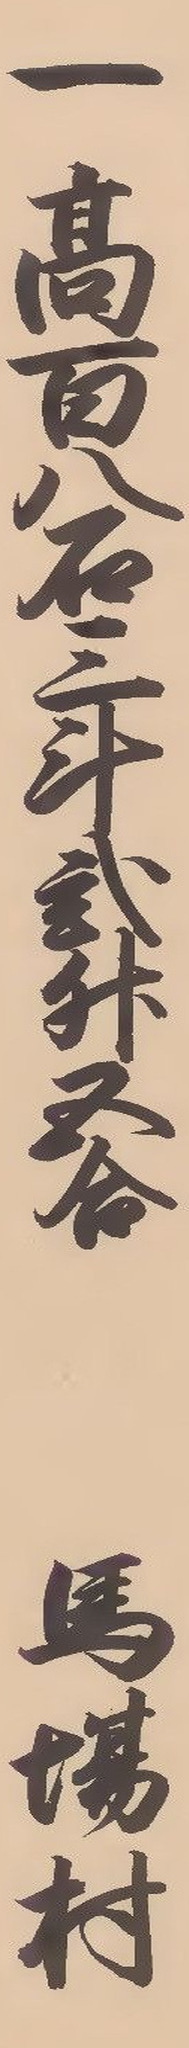一高百八石三斗弐升五合馬場村

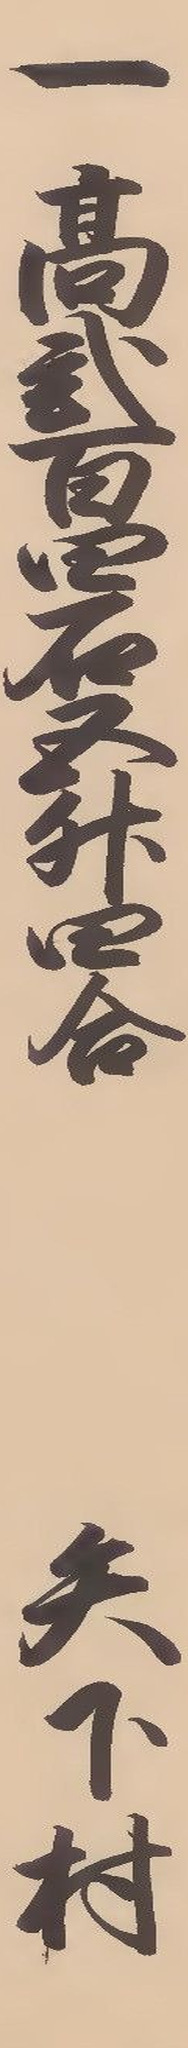一高弐百四石五升四合矢下村
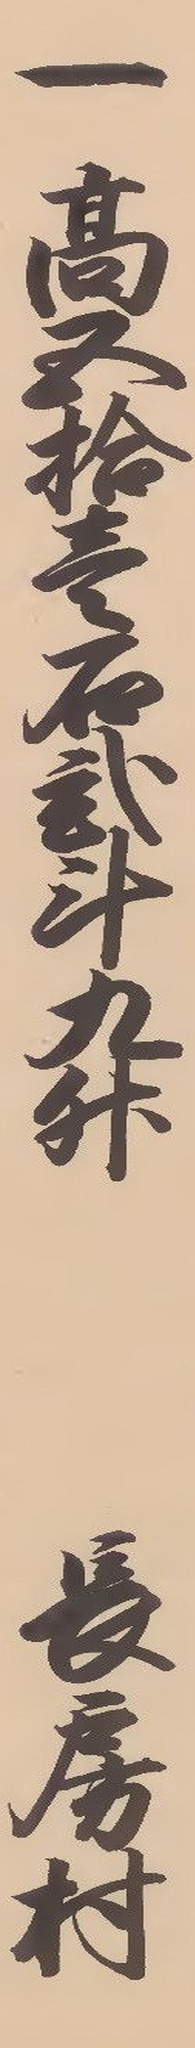一高五拾壱石弐斗九升長房村
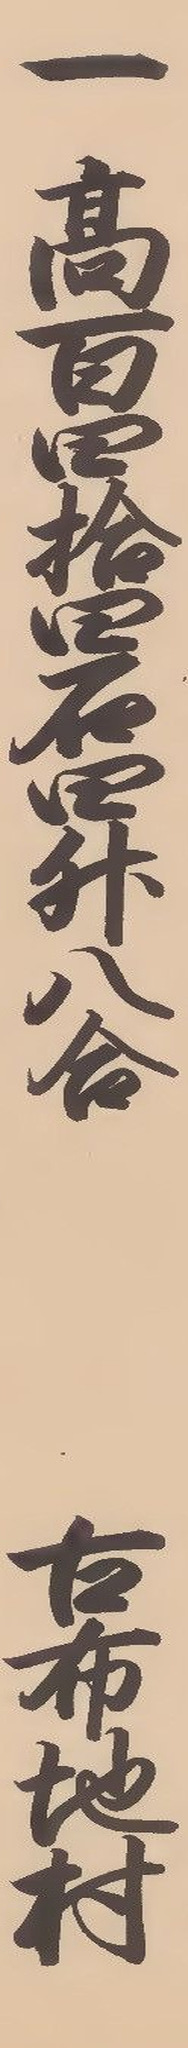一高百四拾四石四升八合古布地村
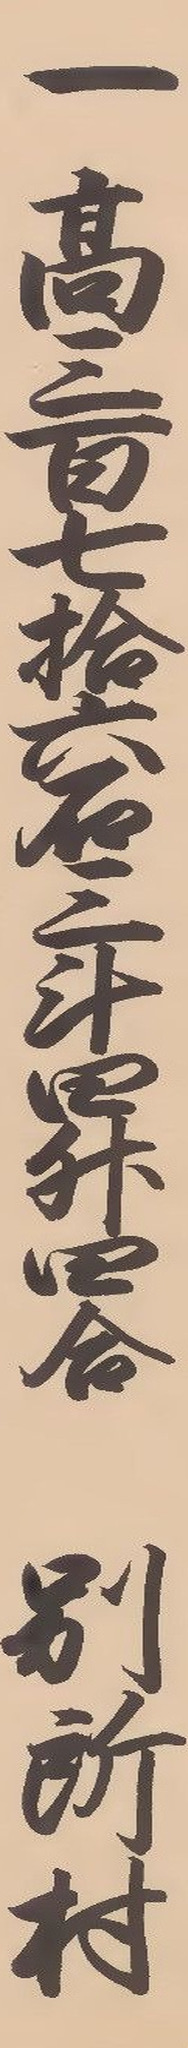一高三百七拾六石三斗四升四合別所村
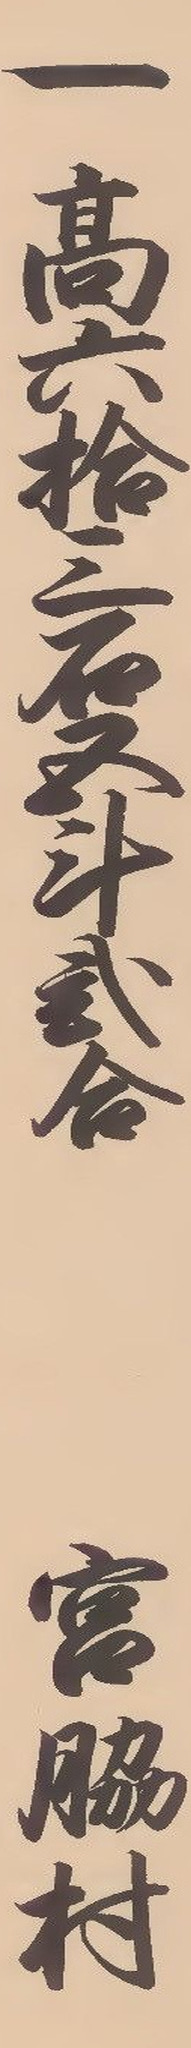一高六拾三石五斗弐合宮脇村
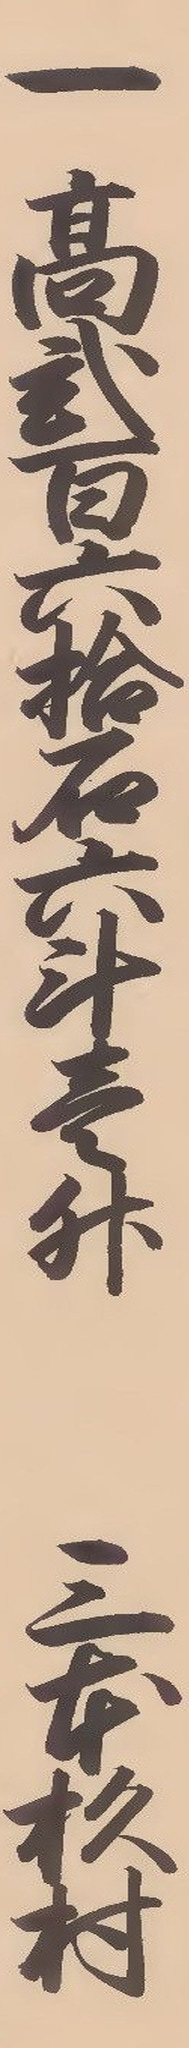一高弐百六拾石六斗壱升三本杉村
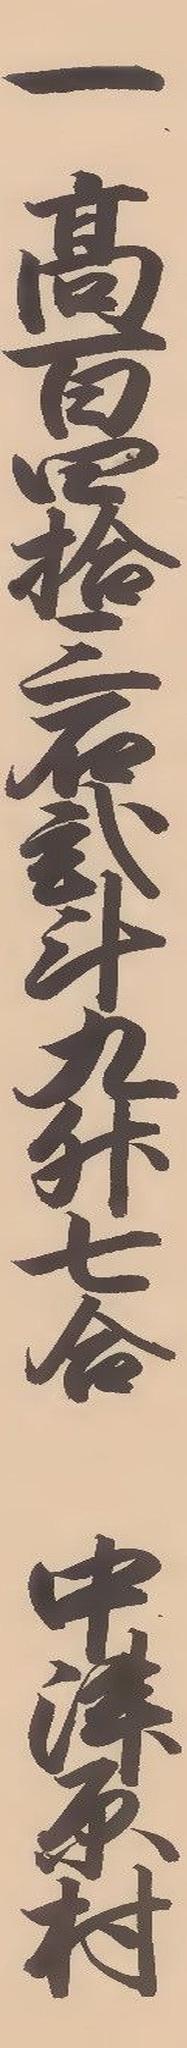一高百四拾三石弐斗九升七合中津原村
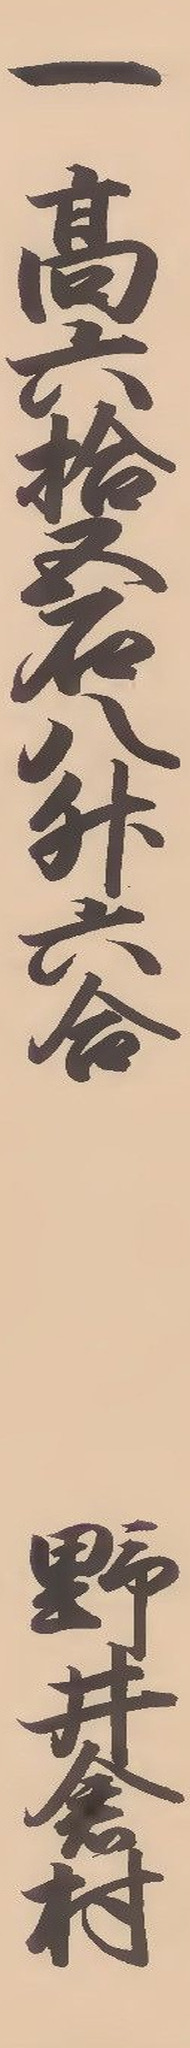一高六拾五石八升六合野井倉村

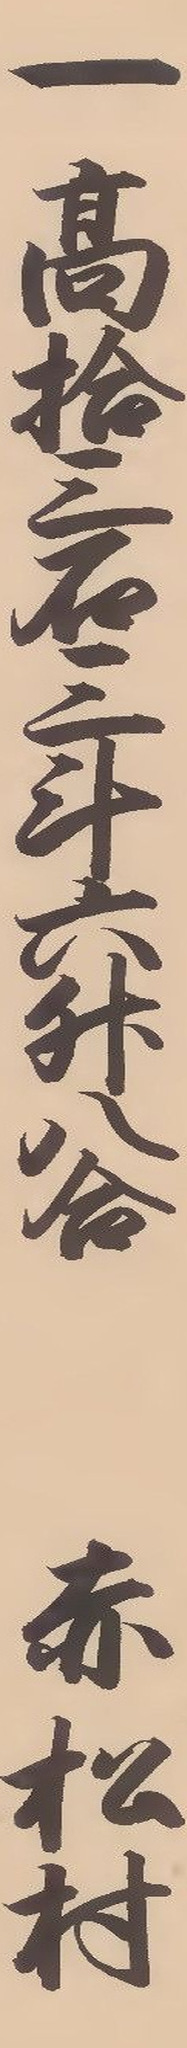一高拾三石三斗六升八合赤松村
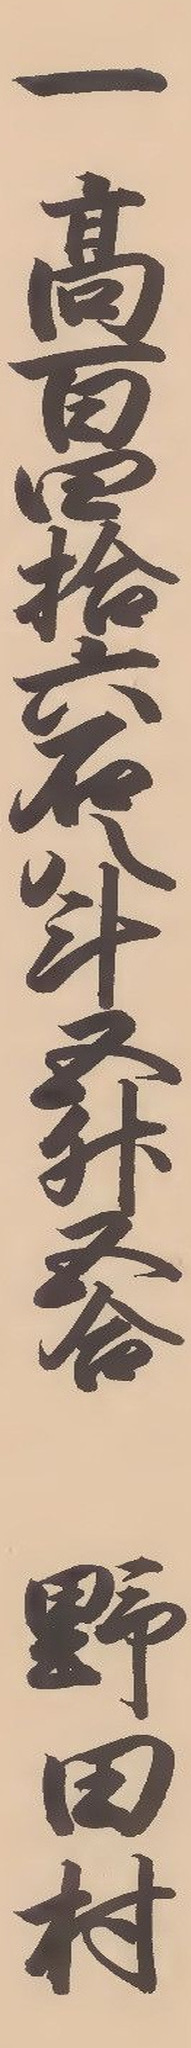一高百四拾六石八斗五升五合野田村
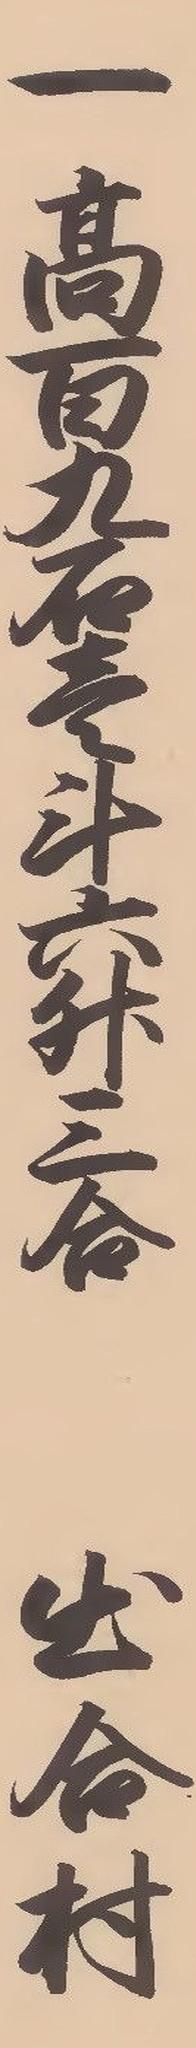一高百九石壱斗六升三合出合村
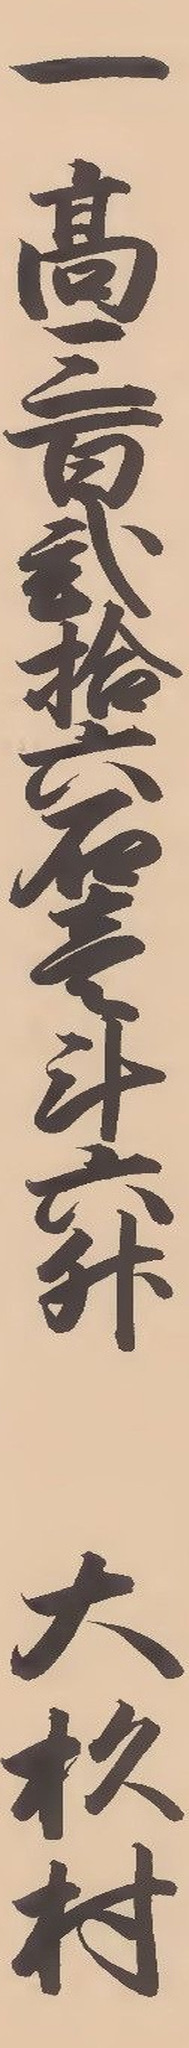一高三百弐拾六石壱斗六升大杉村
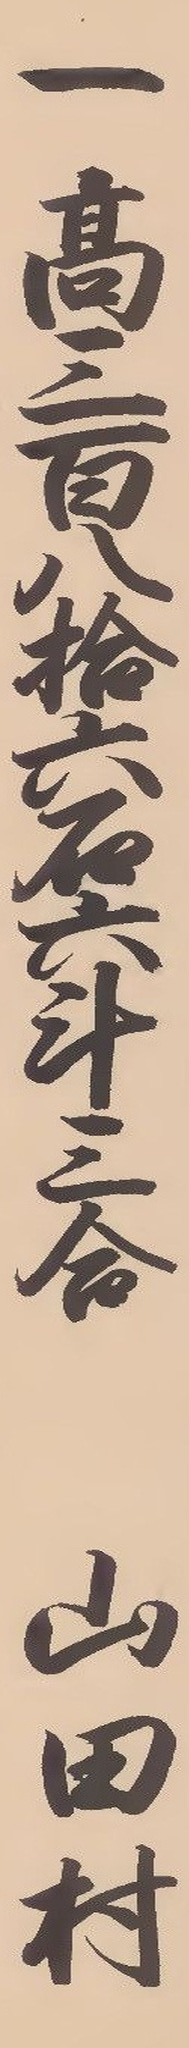一高三百八拾六石六斗三合山田村
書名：伯耆国郷帳
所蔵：国立公文書館 National Archives of Japan
